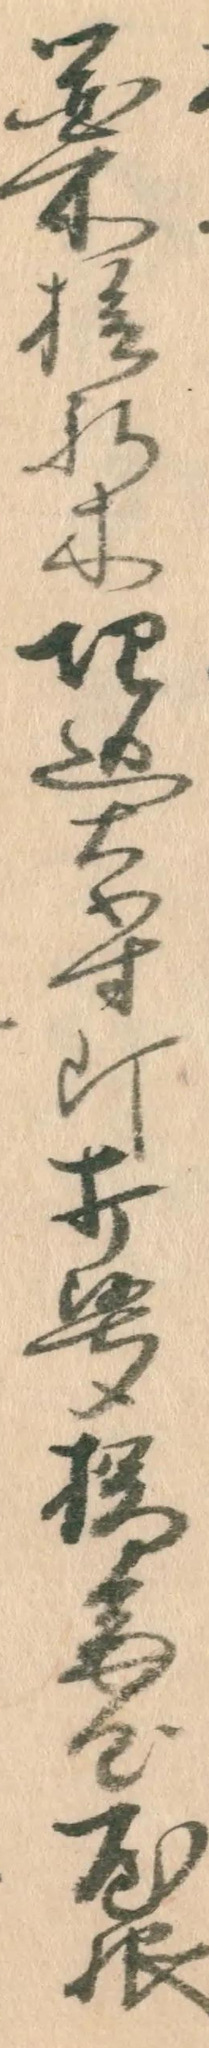箇所桧新木埋込大五寸釘打堅メ橋番屋屋根
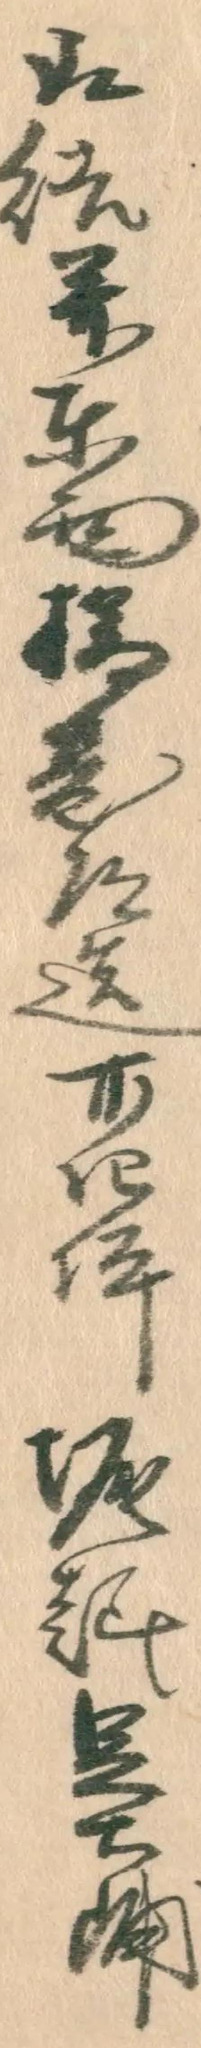取繕并東西橋台道造廿四坪掘起し足土鋪
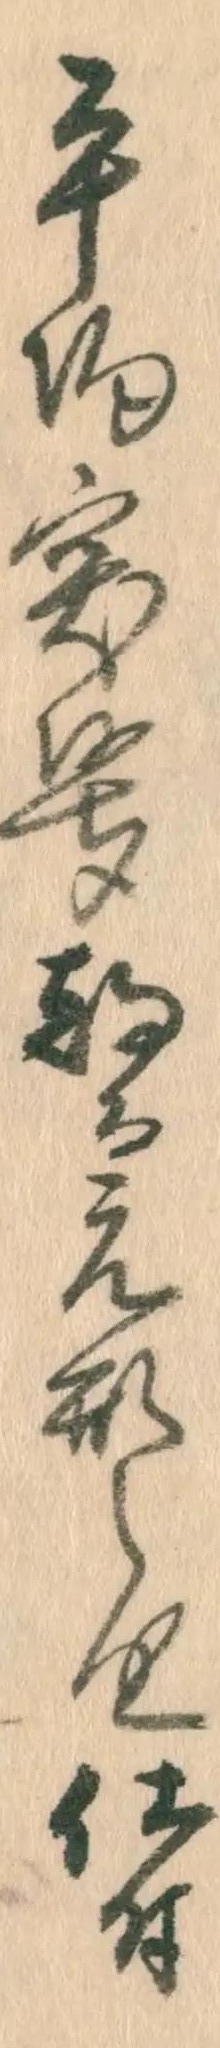平均突堅メ都而元形之通仕付
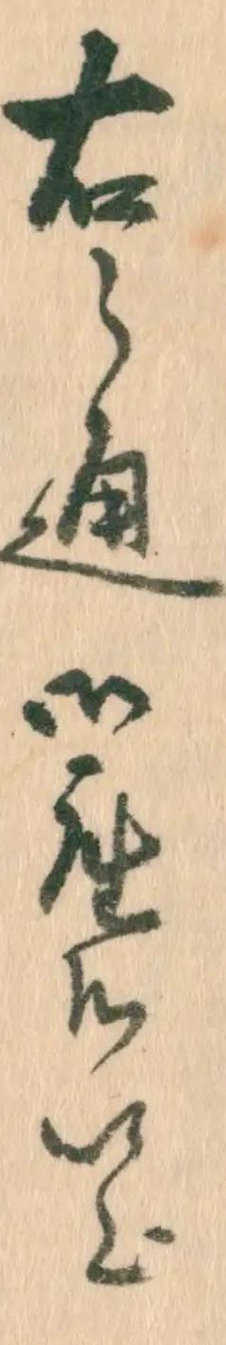右之通御座候以上
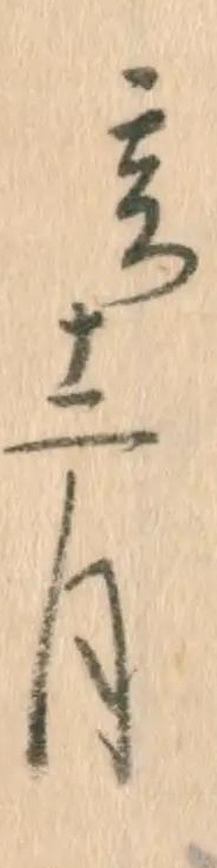亥十二月
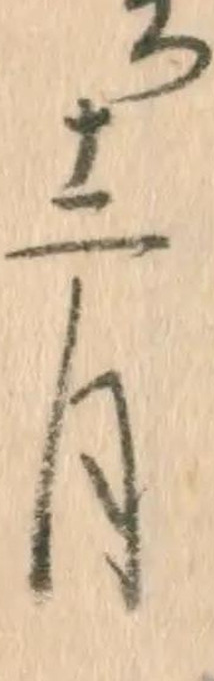亥十二月
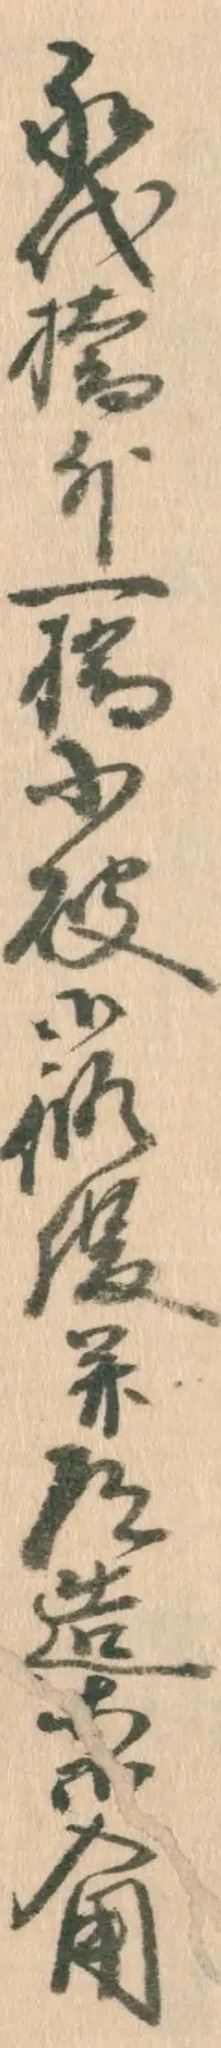永代橋外一橋小破御修復并道造等御入用
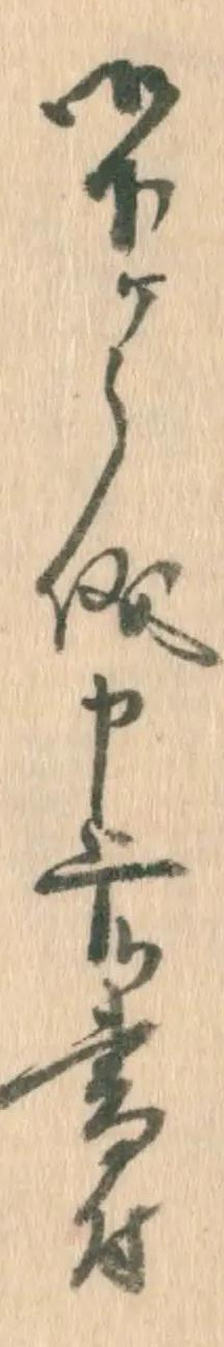御下ケ之儀申上候書付
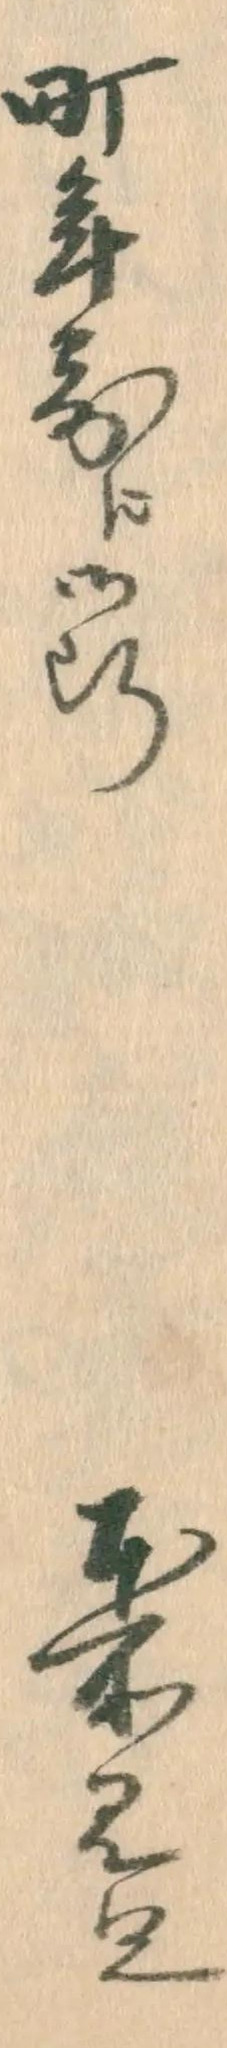町年寄え御断本所見廻
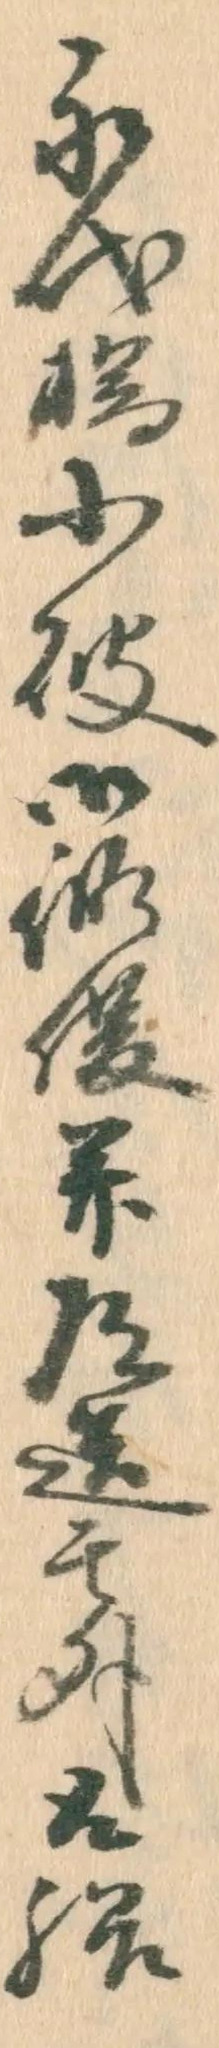永代橋小破御修復并道造其外取繕
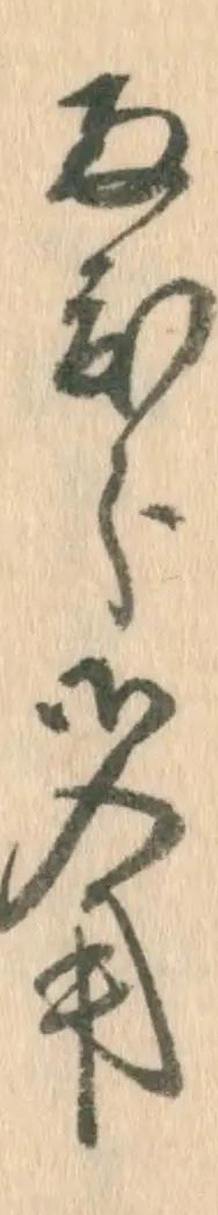両度分御入用
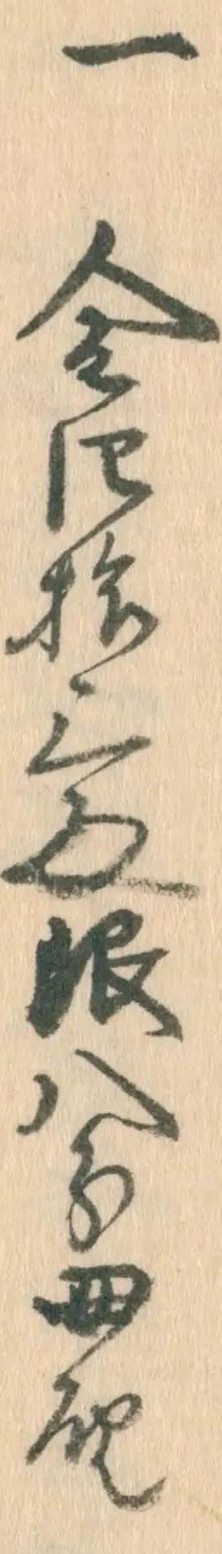一金四拾三両銀八分四厘

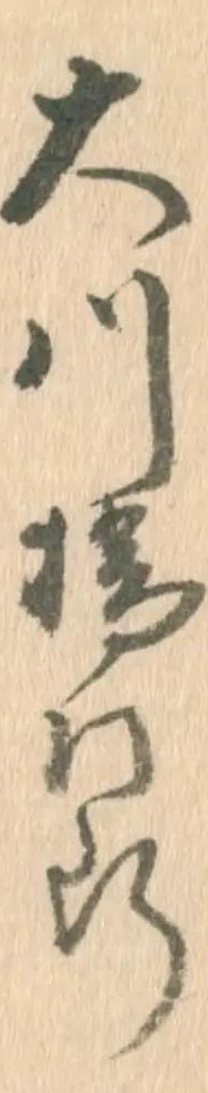大川橋同断
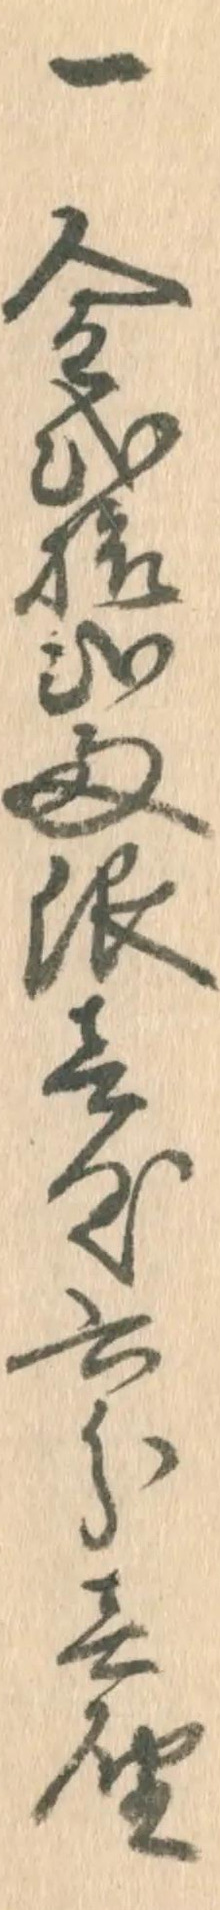一金弐拾弐両銀壱匁六分壱厘
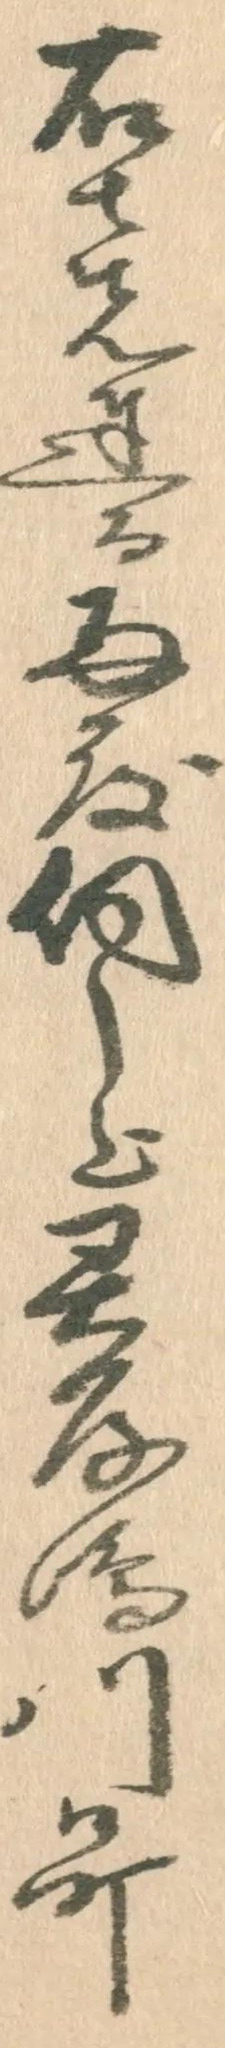右は先達而両度伺之上霊岸島川口町
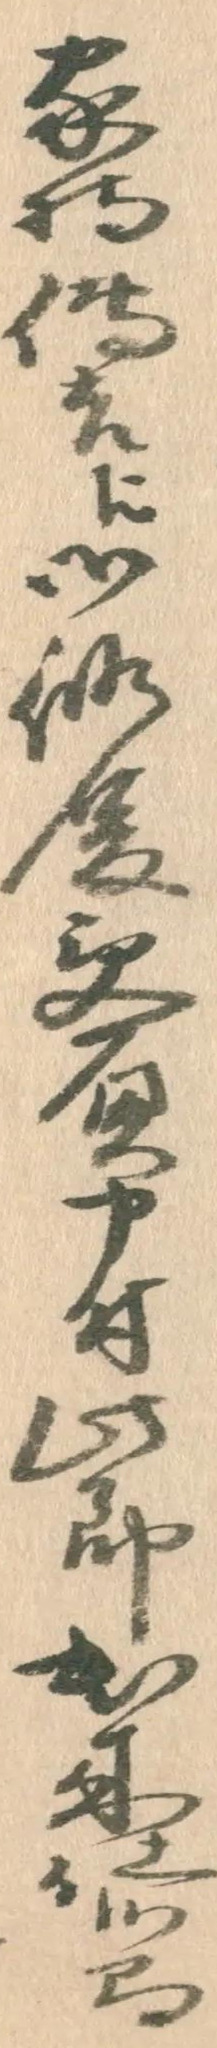家持伝吉え御修復受負申付此節出来仕候間
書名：三橋 17巻. [7] 三橋小破御修復書留　但御奉行御掛リ替地震潰橋番屋　嘉永四亥年より安政二卯年迄　上
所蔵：国立国会図書館 National Diet Library, JAPAN
